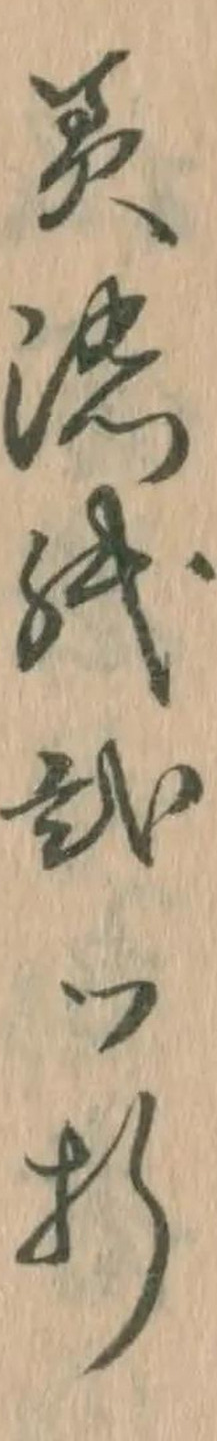美濃紙弐つ折
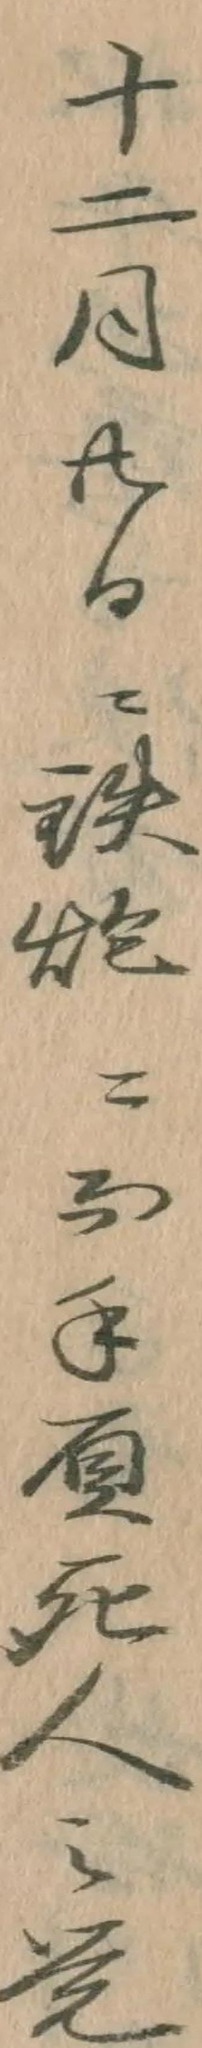十二月廿日に鉄炮に而手負死人之覚
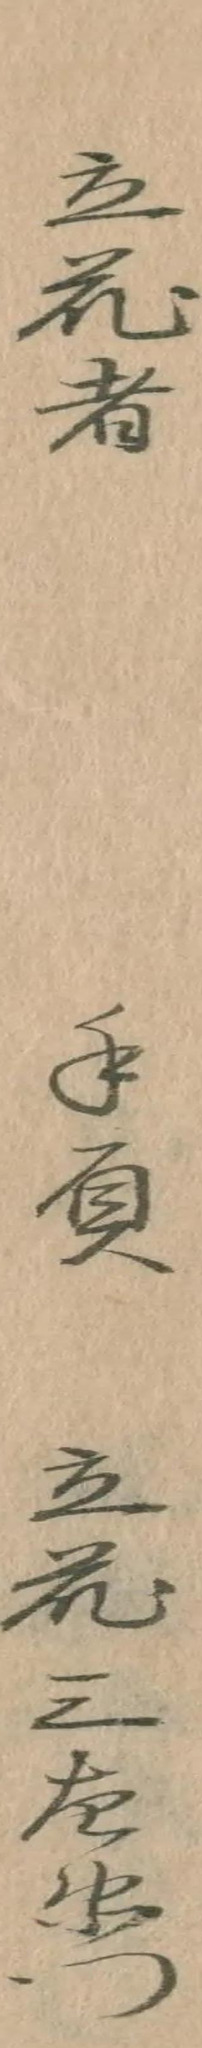立花者手負立花三左衛門
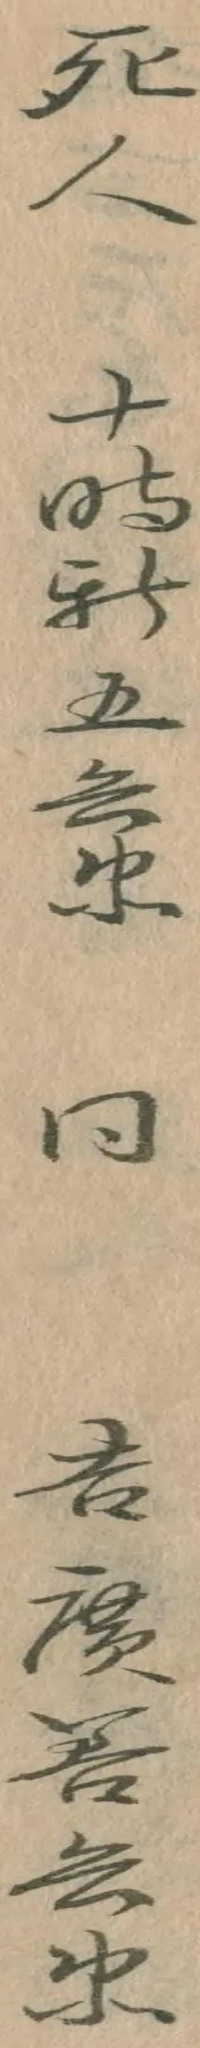死人十時新五兵衛同吉広善兵衛
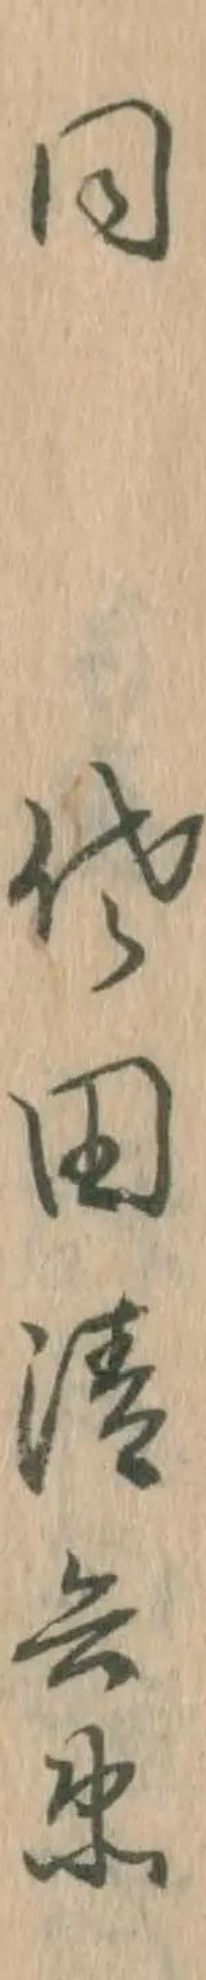同佐田清兵衛
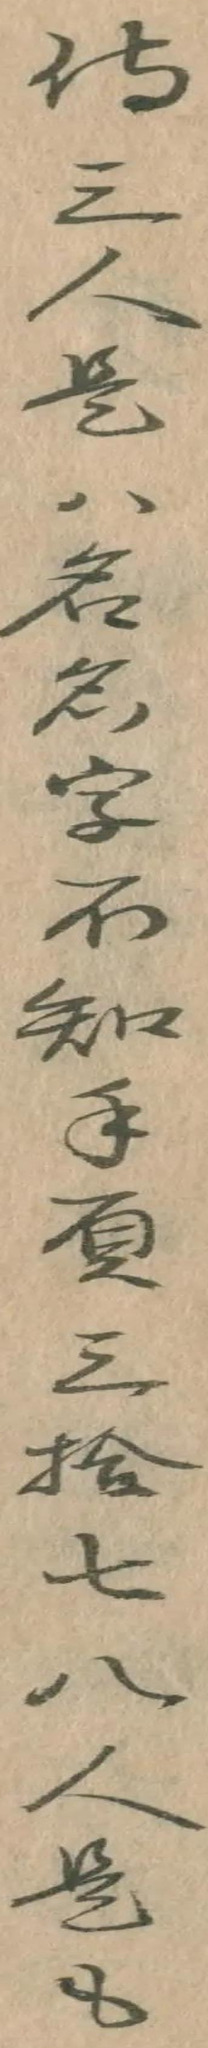侍三人是は名名字不知手負三拾七八人是も
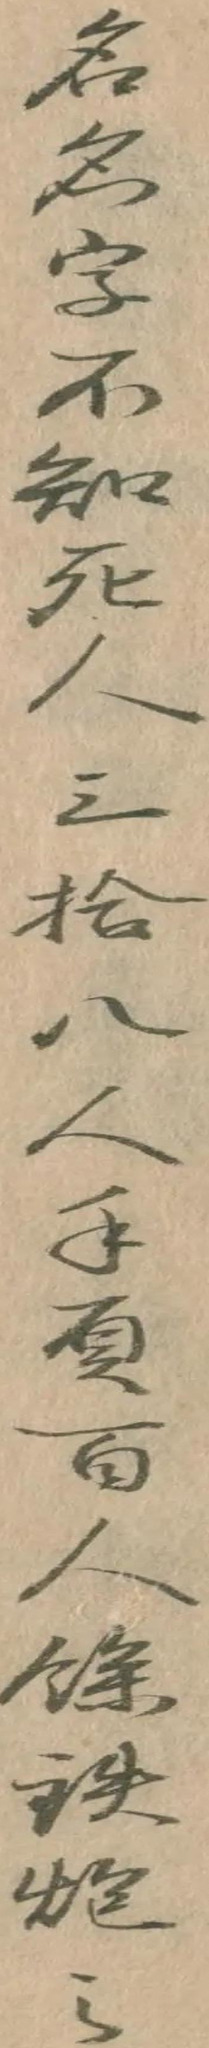名名字不知死人三拾八人手負百人余鉄炮之
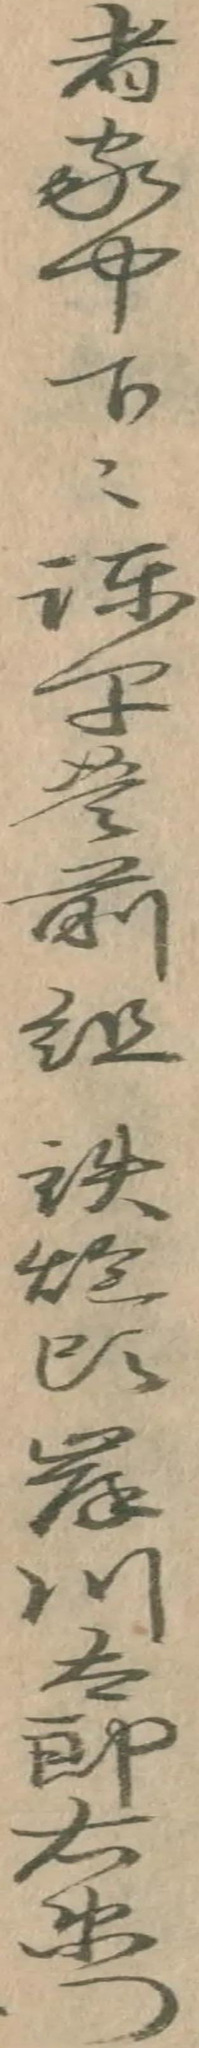者家中下々諌早豊前組鉄炮頭岸川太郎右衛門
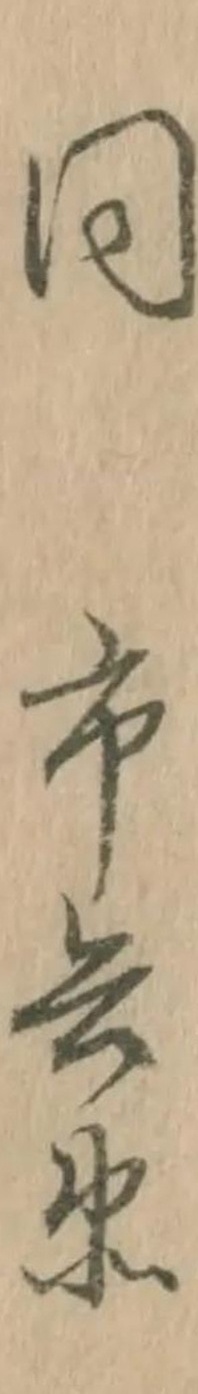同市兵衛

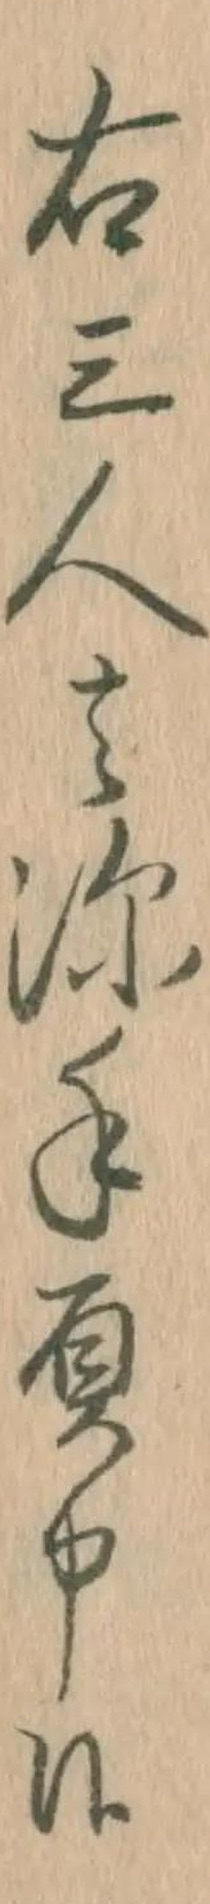右三人者深手負申候
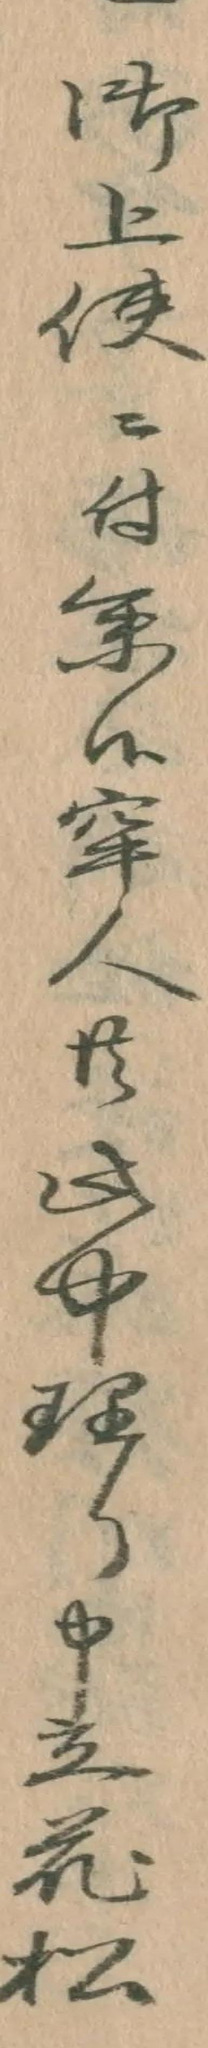一御上使に付参候牢人共此中理り申立花松
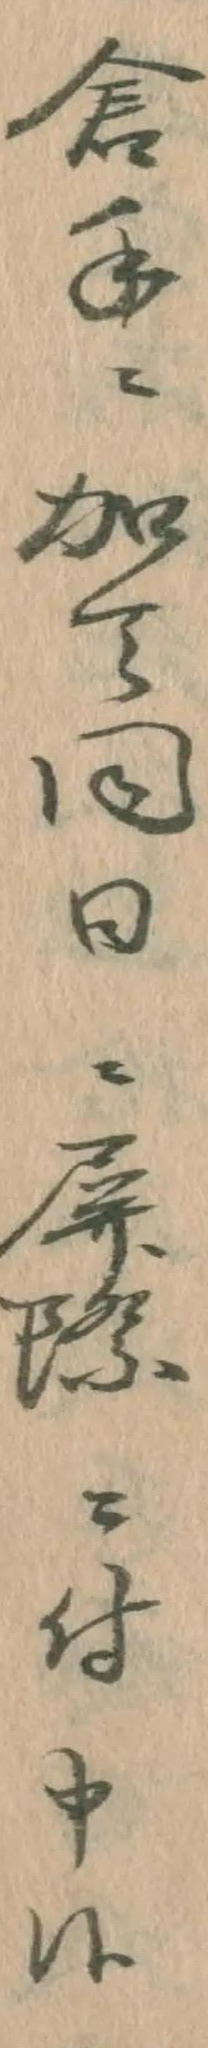倉手に加て同日に屏際に付申候
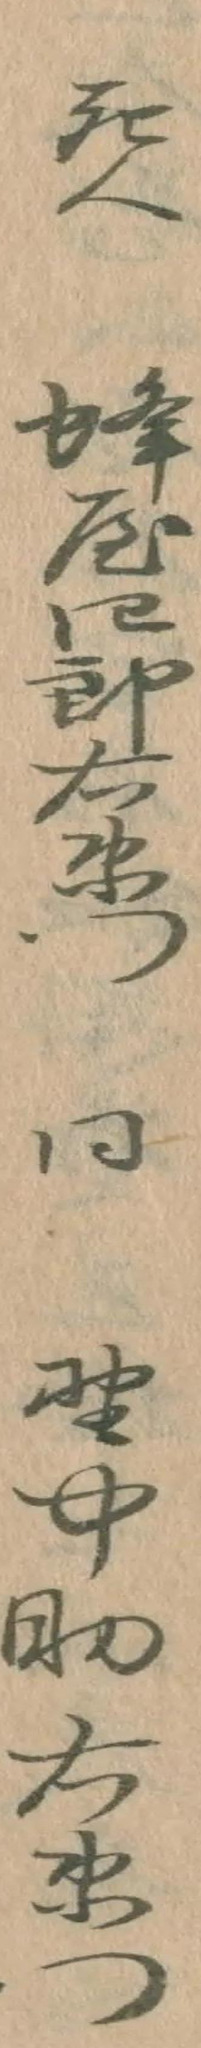死人蜂屋四郎右衛門同野中助右衛門
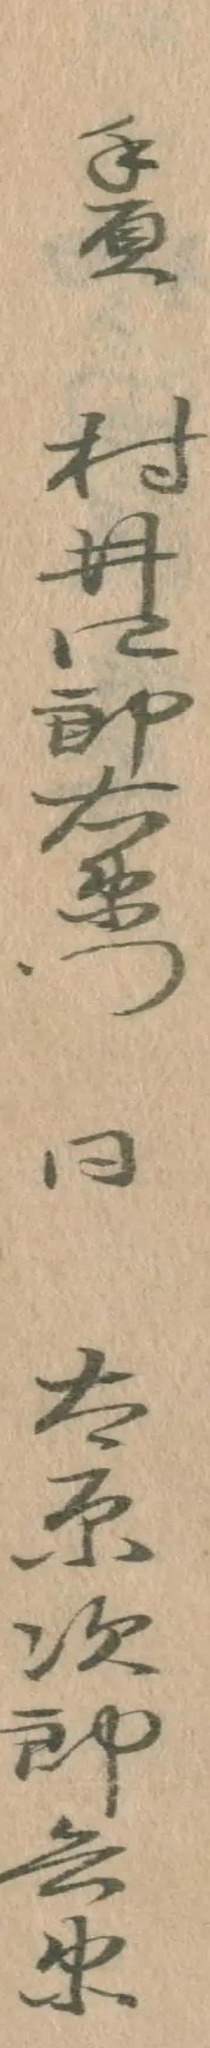手負村井四郎右衛門同太原次郎兵衛
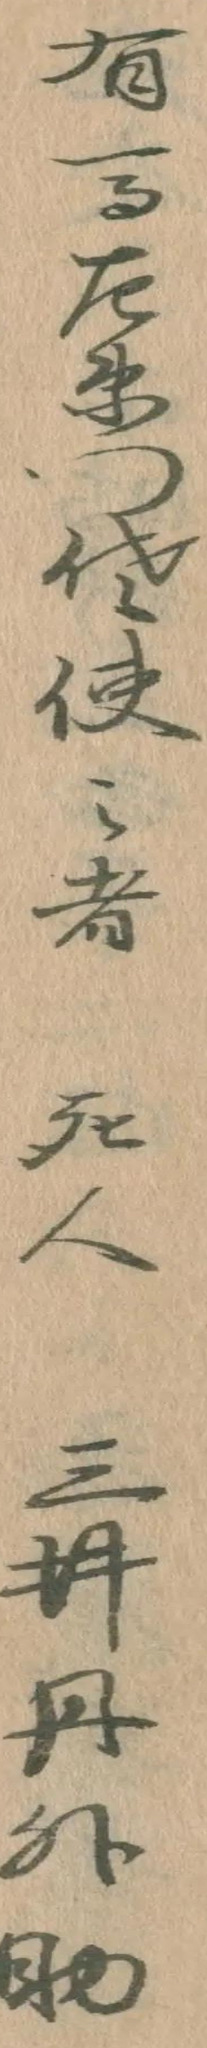有馬左衛門佐使之者死人三井丹外助
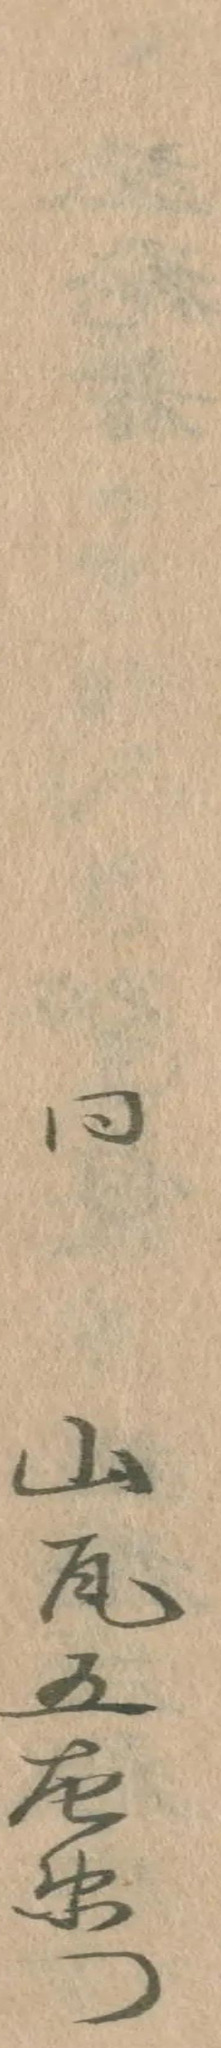同山尾五左衛門
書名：切支丹御退治記 49巻. [4]
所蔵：国立国会図書館 National Diet Library, JAPAN
